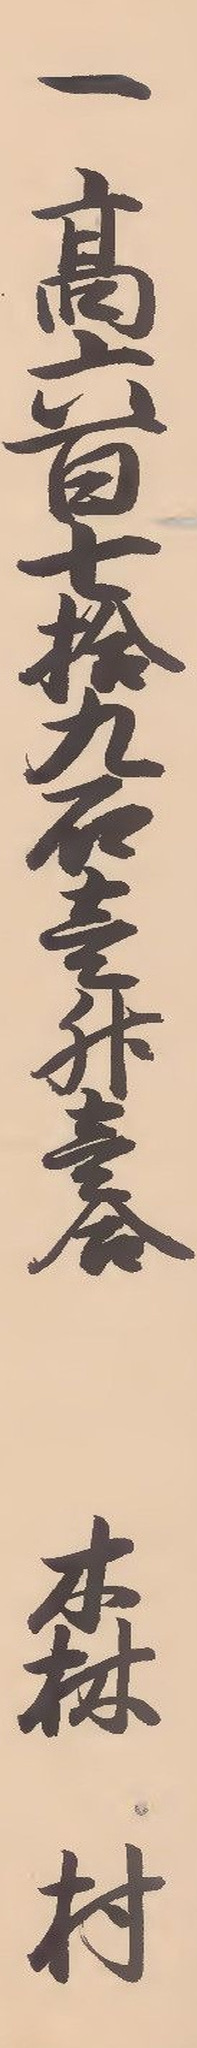一高六百七拾九石壱升壱合森村
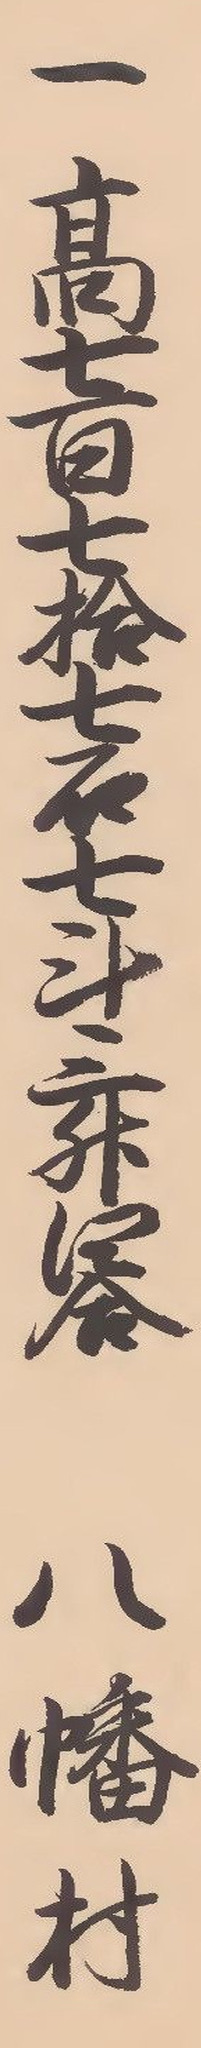一高七百七拾七石七斗三升四合八幡村
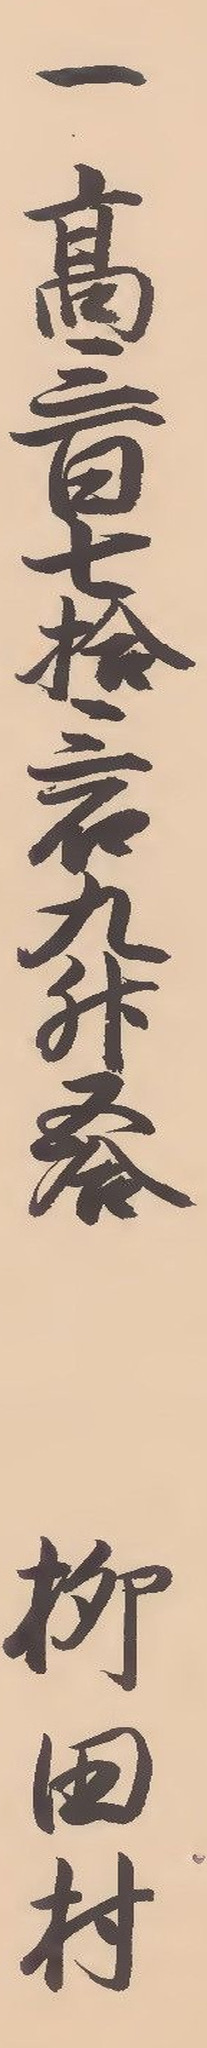一高三百七拾三石九升五合柳田村
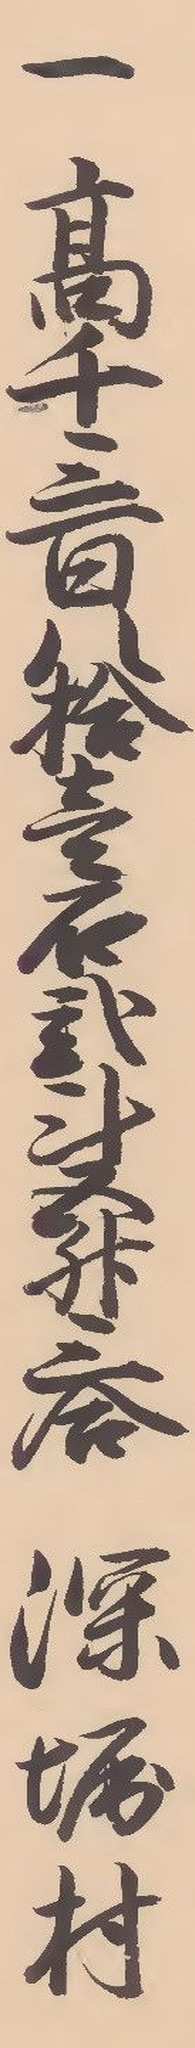一高千三百八拾壱石弐斗五升三合深堀村

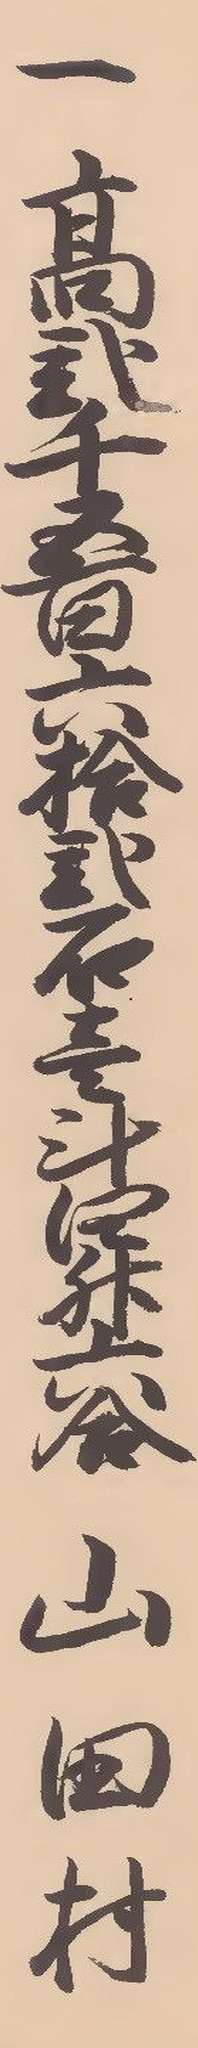一高弐千五百六拾弐石壱斗四升六合山田村
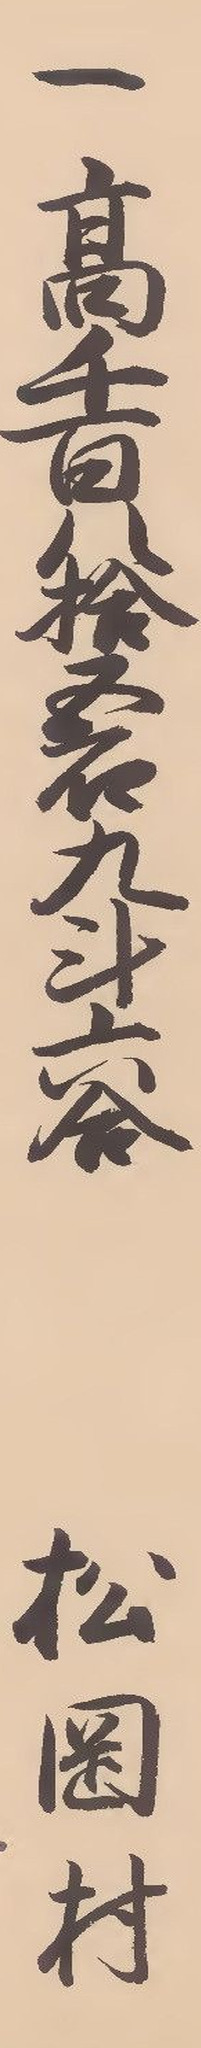一高千百八拾五石九斗六合松岡村
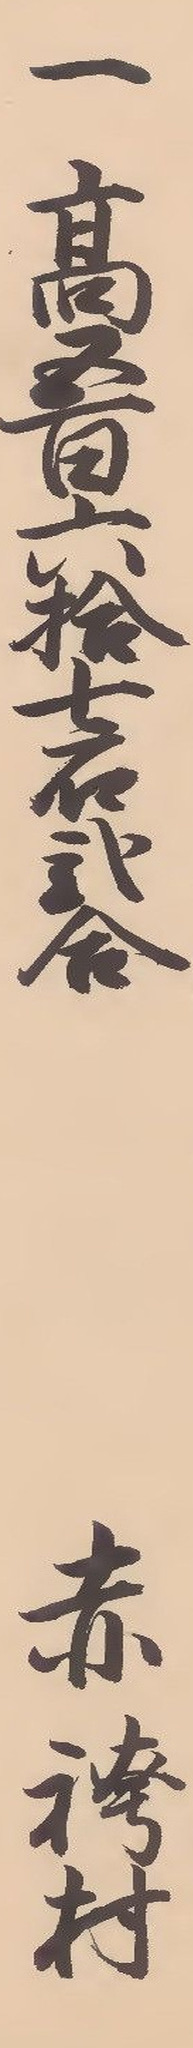一高五百六拾七石弐合赤袴村
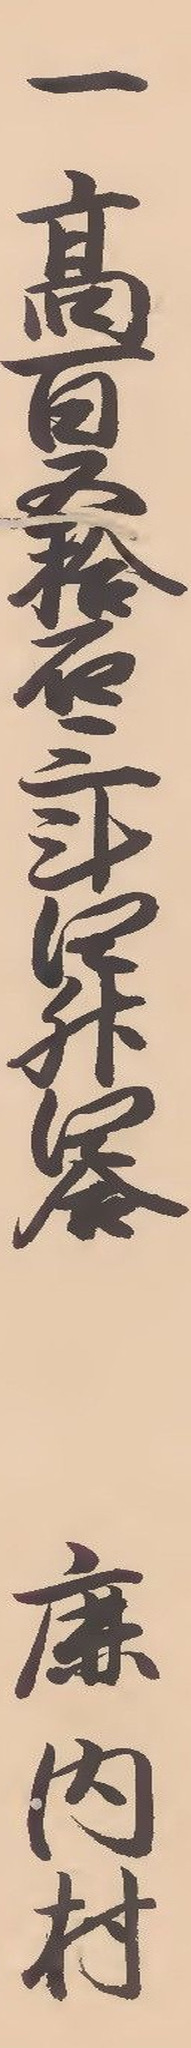一高百五拾石三斗四升四合鹿内村
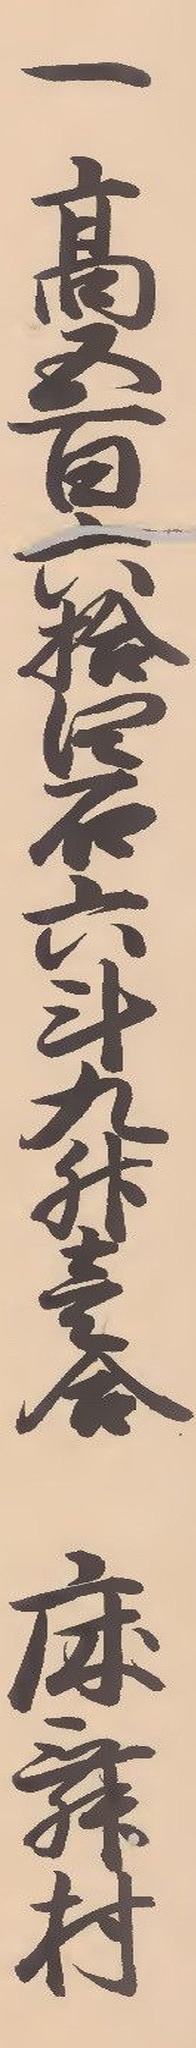一高五百六拾四石六斗九升壱合床舞村
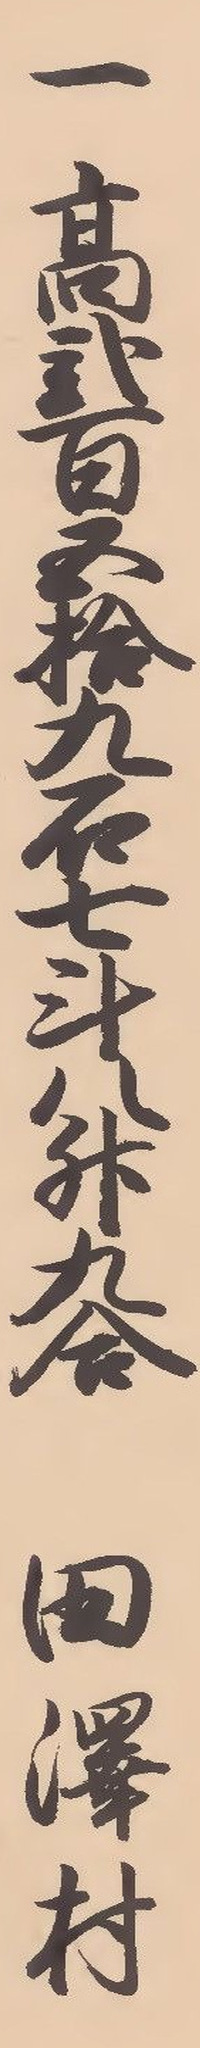一高弐百五拾九石七斗八升九合田沢村
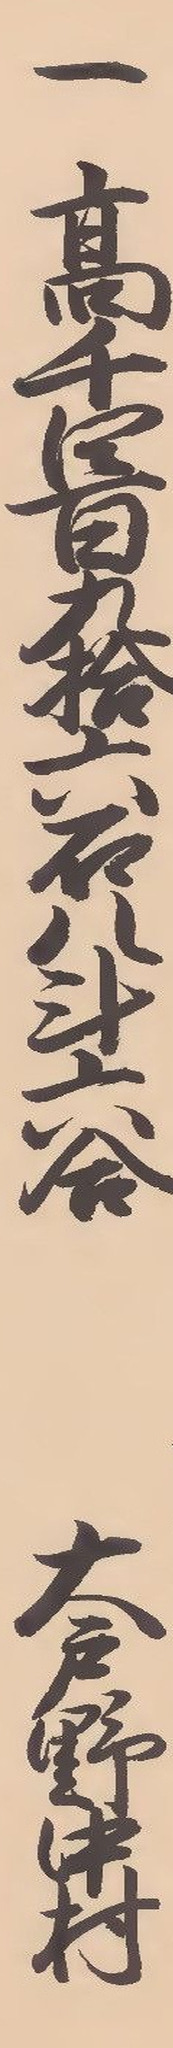一高千四百九拾六石八斗六合大戸野中村
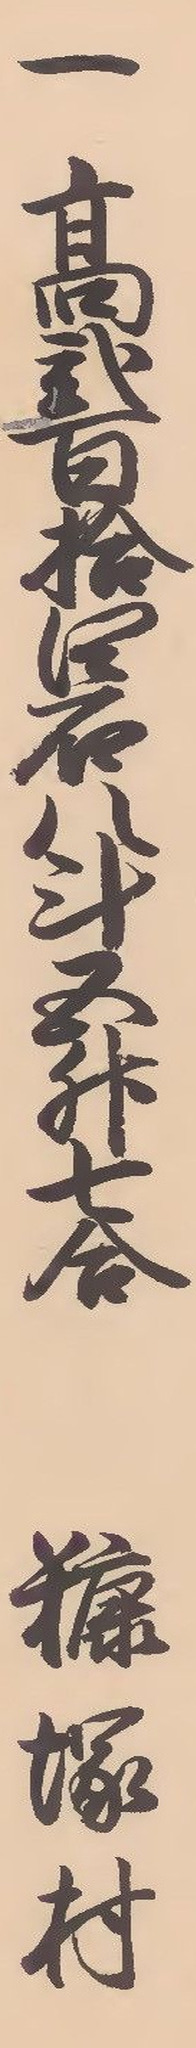一高弐百拾四石八斗五升七合糠塚村

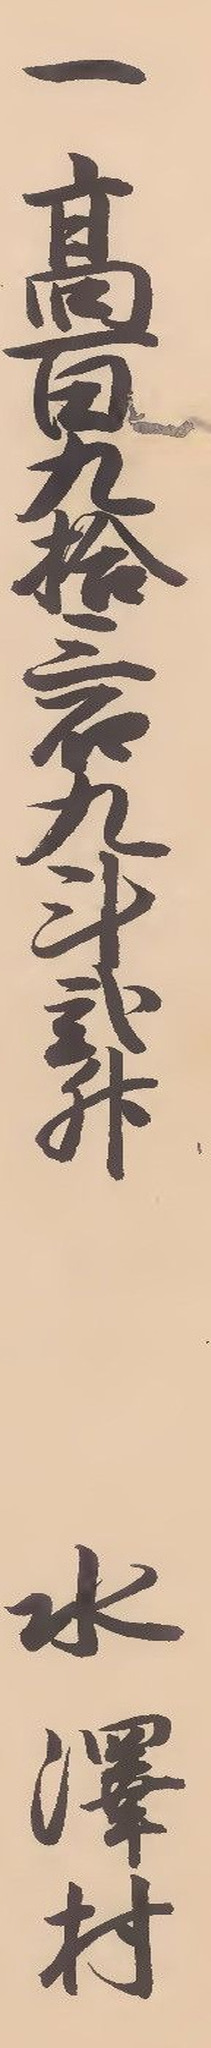一高百九拾三石九斗弐升水沢村
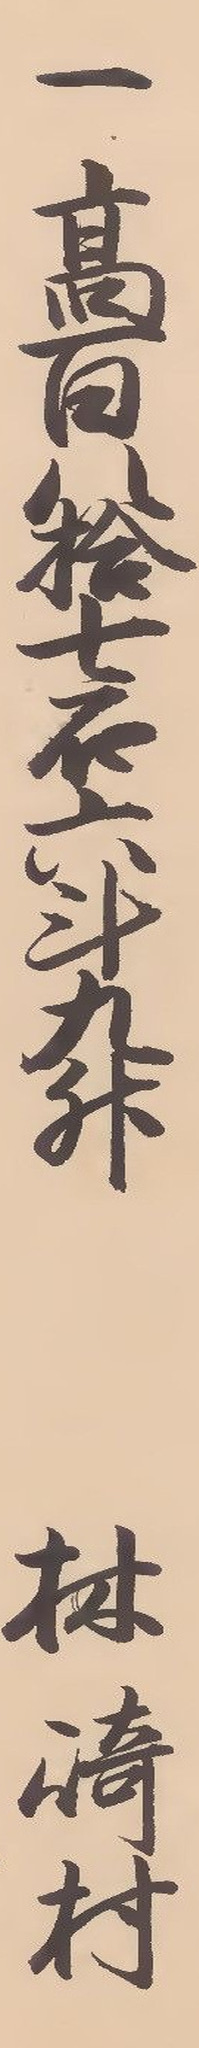一高百八拾七石六斗九升林崎村
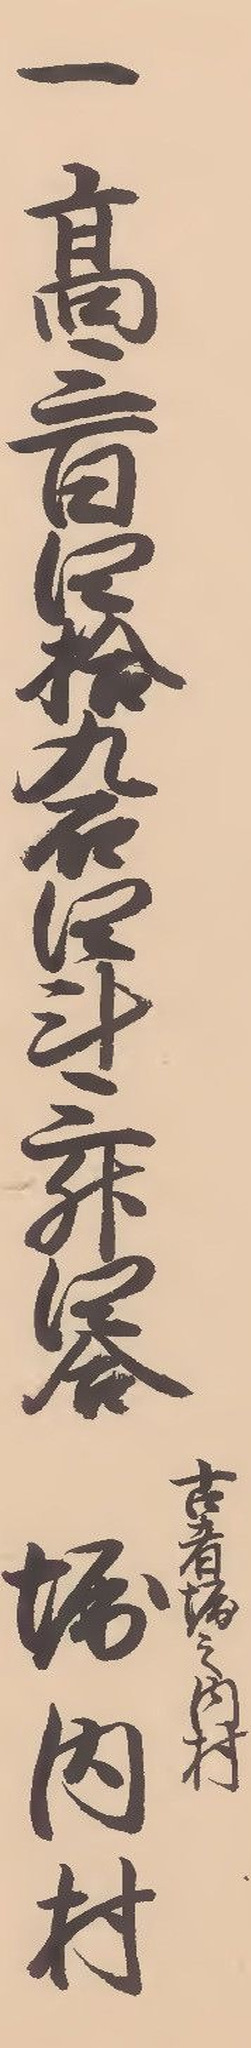一高三百四拾九石四斗三升四合堀内村
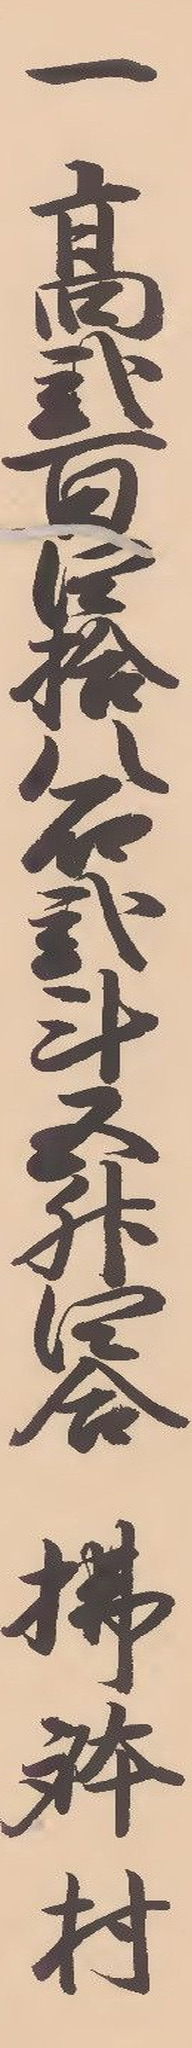一高弐百四拾八石弐斗五升四合払体村
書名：出羽国郷帳　５
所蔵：国立公文書館 National Archives of Japan
